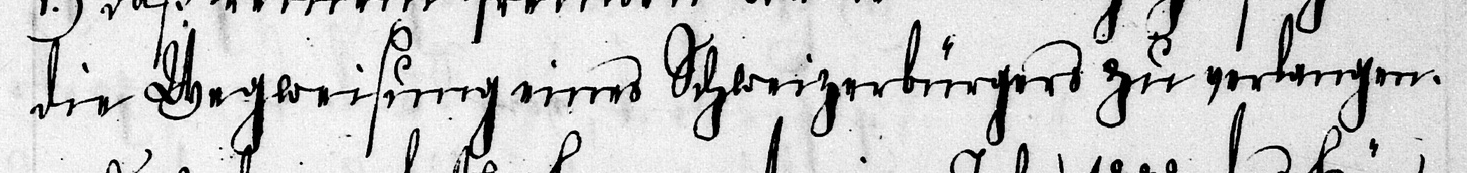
die Wegweisung eines Schweizerbürgers zu verlangen.
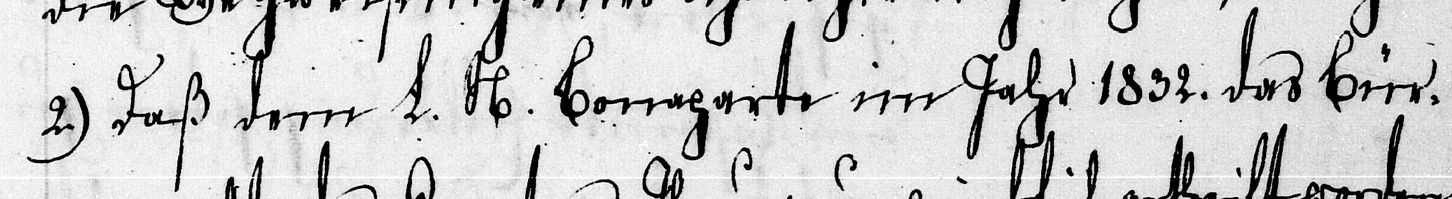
2.) Daß dem L. N. Bonaparte im Jahr 1832. das Bür¬
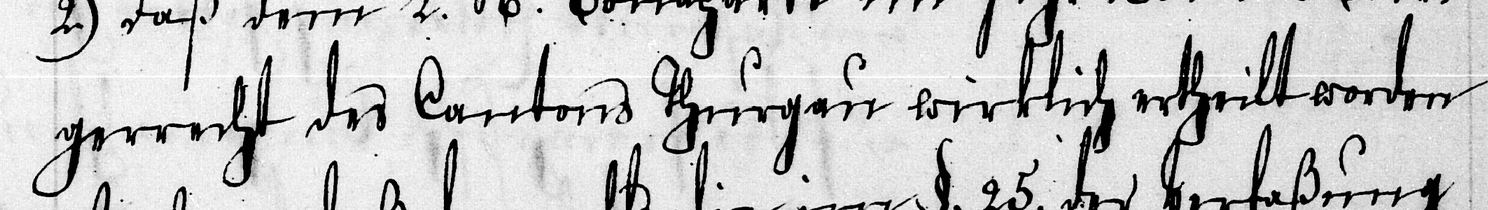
gerrecht des Cantons Thurgau wirklich ertheilt worden
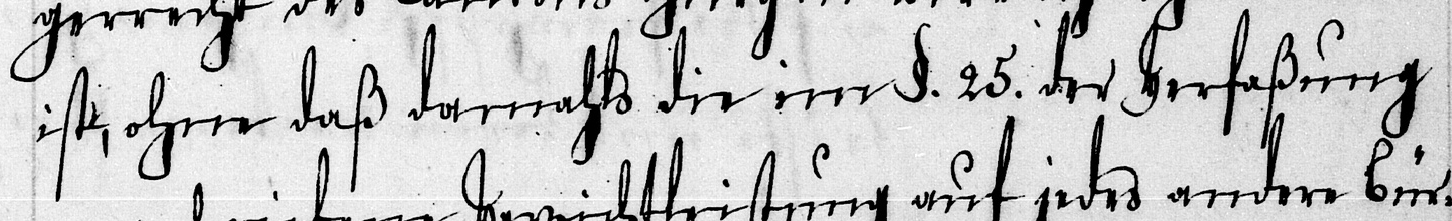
ist, ohne daß damahls die im §. 25. der Verfaßung
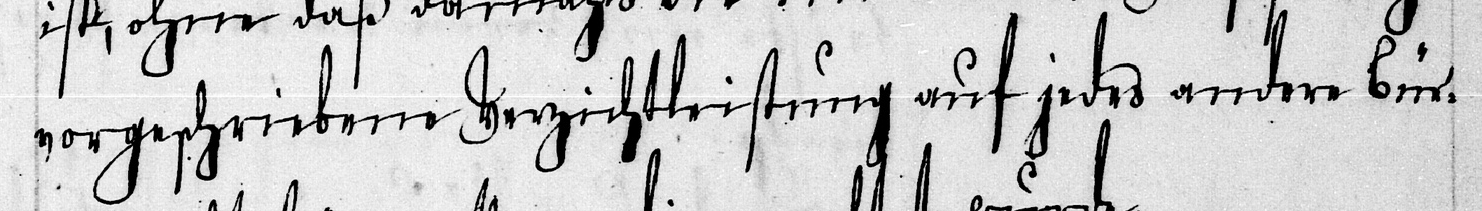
vorgeschriebene Verzichtleistung auf jedes andere Bür¬
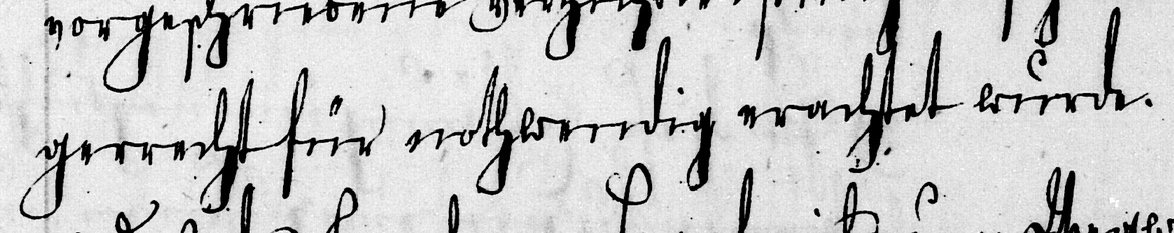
gerrecht für nothwendig erachtet wurde.
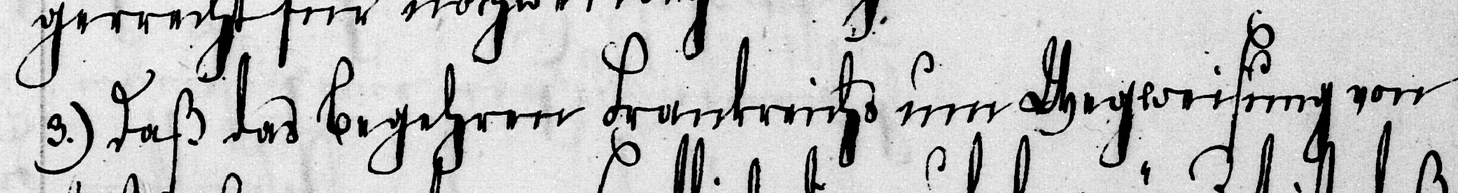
3.) Daß das Begehren Frankreichs um Wegweisung von
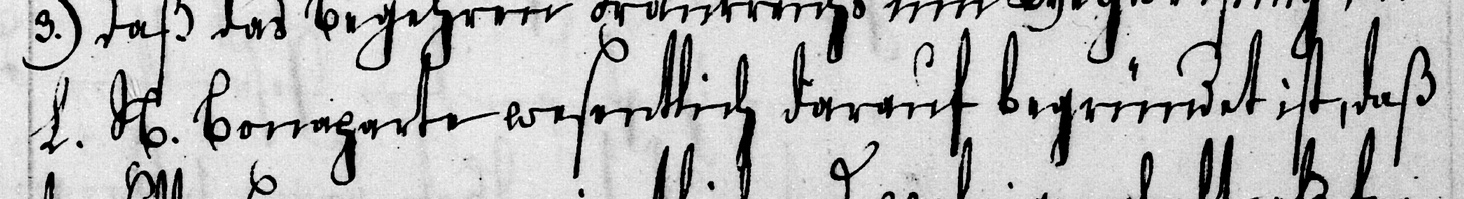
L. N. Bonaparte wesentlich darauf begründet ist, daß
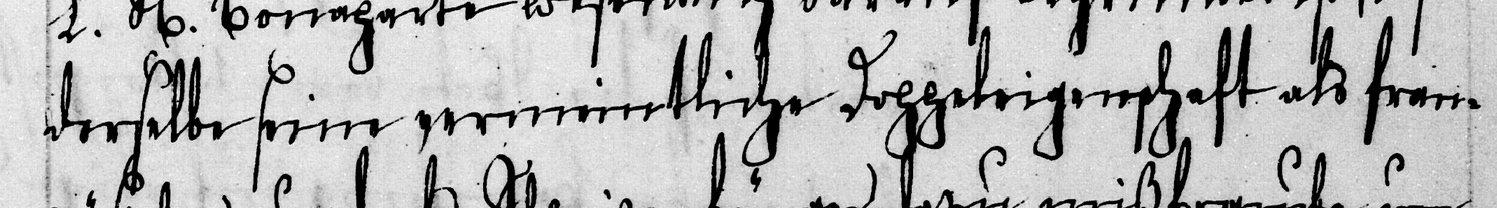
derselbe seine vermeintliche Doppeleigenschaft als fran¬
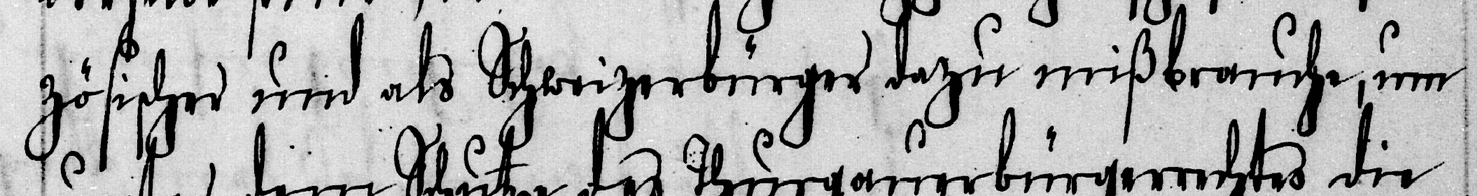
zösischer und als Schweizerbürger dazu mißbrauche, um
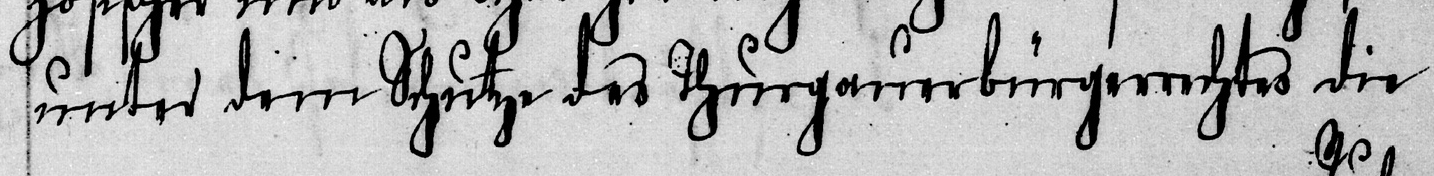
unter dem Schutze des Thurgauerbürgerrechtes die
